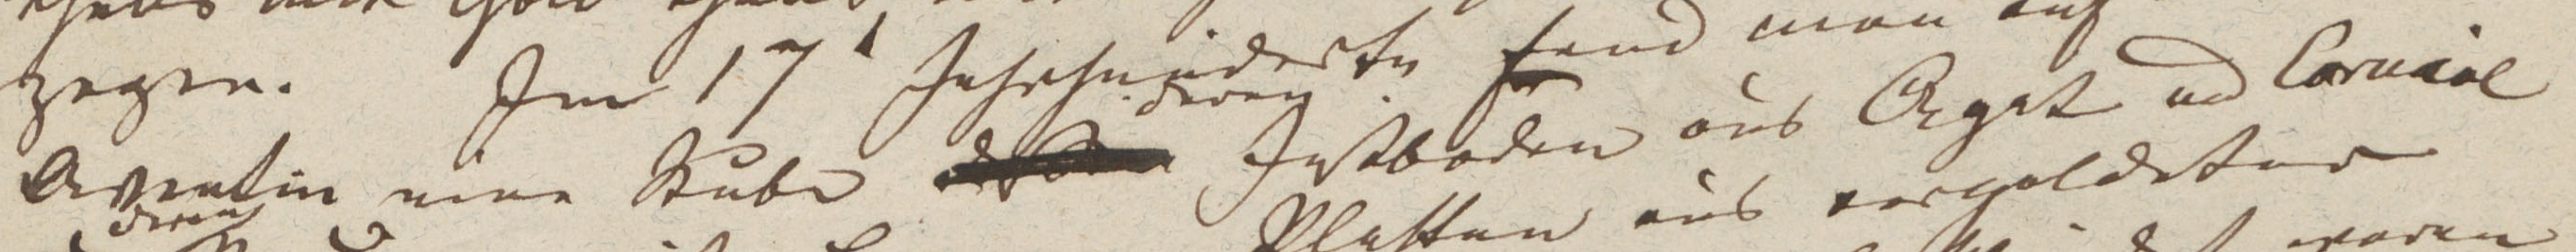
Aventin eine Stube dessen deren Fussboden aus Agat und Carniol
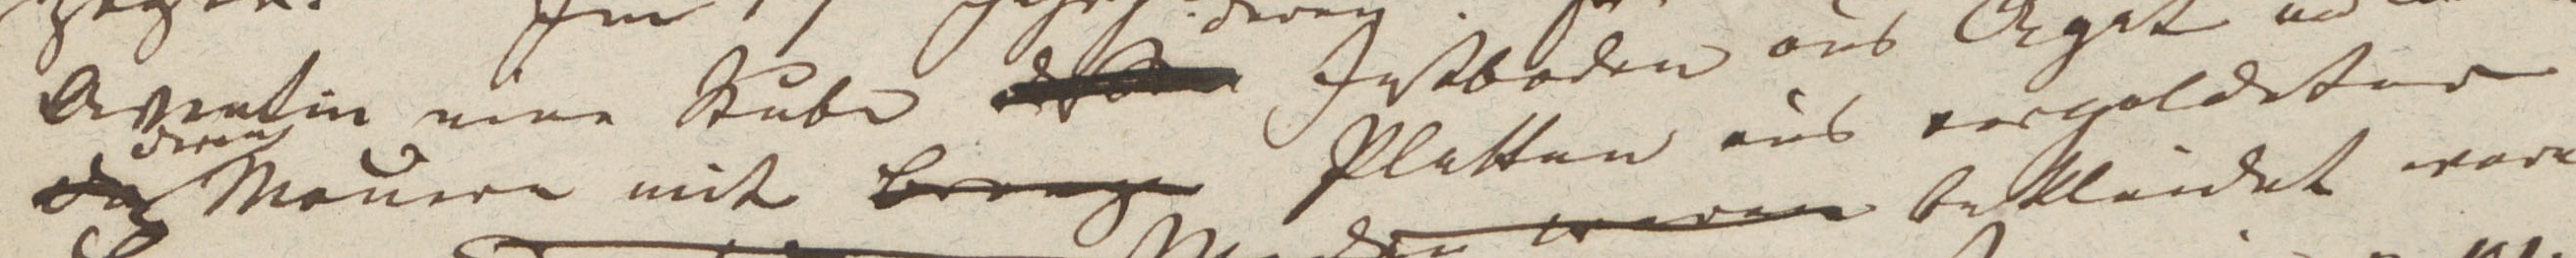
deren Mauern mit Bronze Platten aus vergoldeter
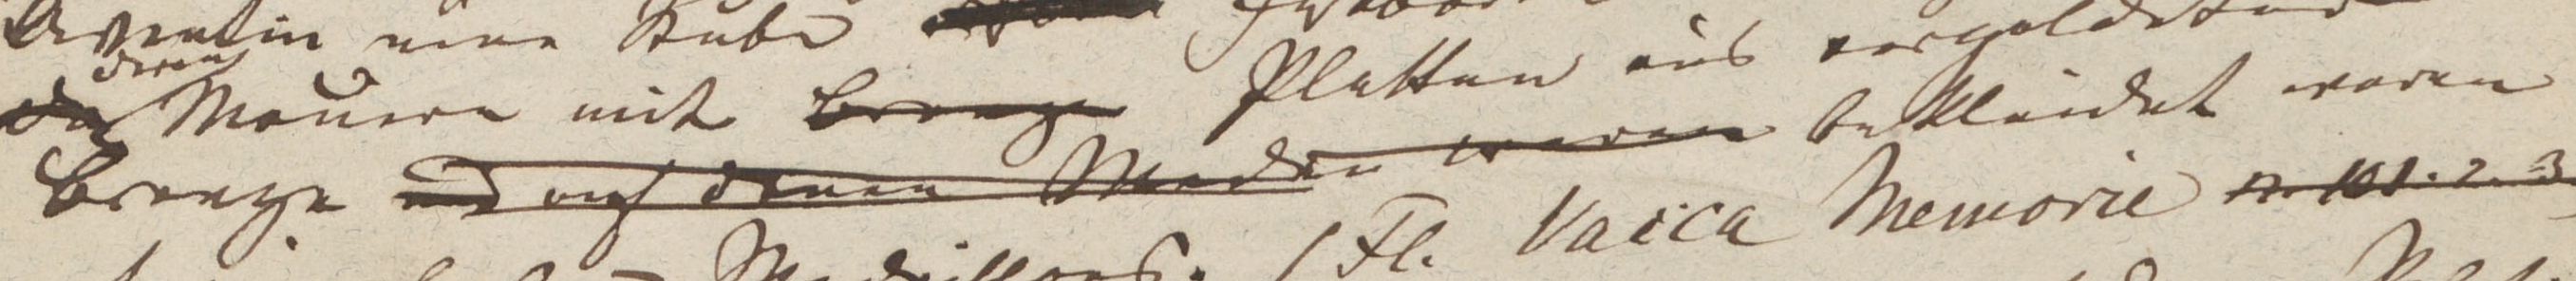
Bronze und auf denen Md waren bekleidet waren
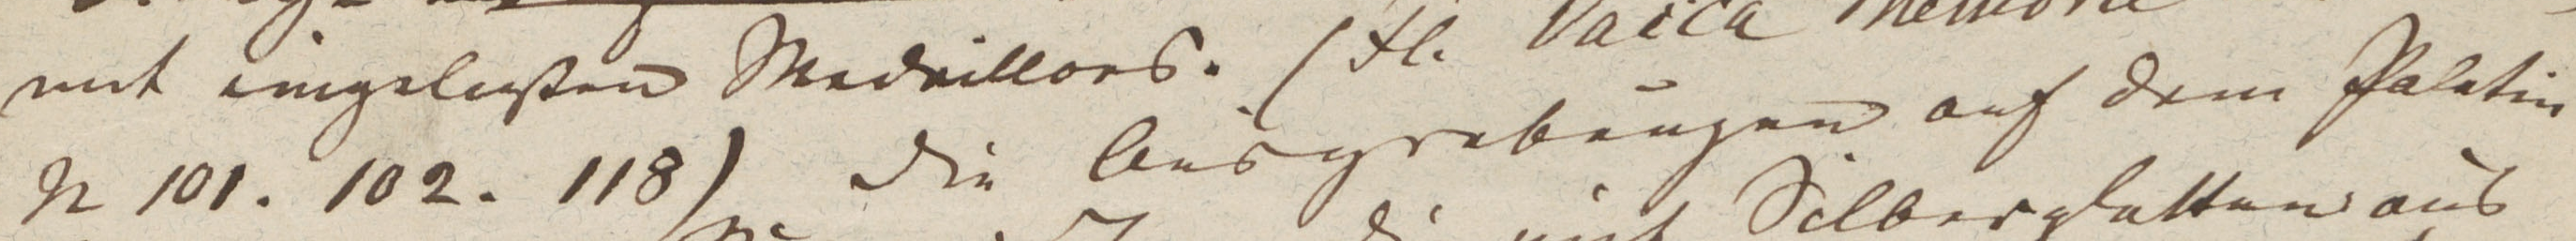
N 101. 102. 118) Die Ausgrabungen auf dem Palatin
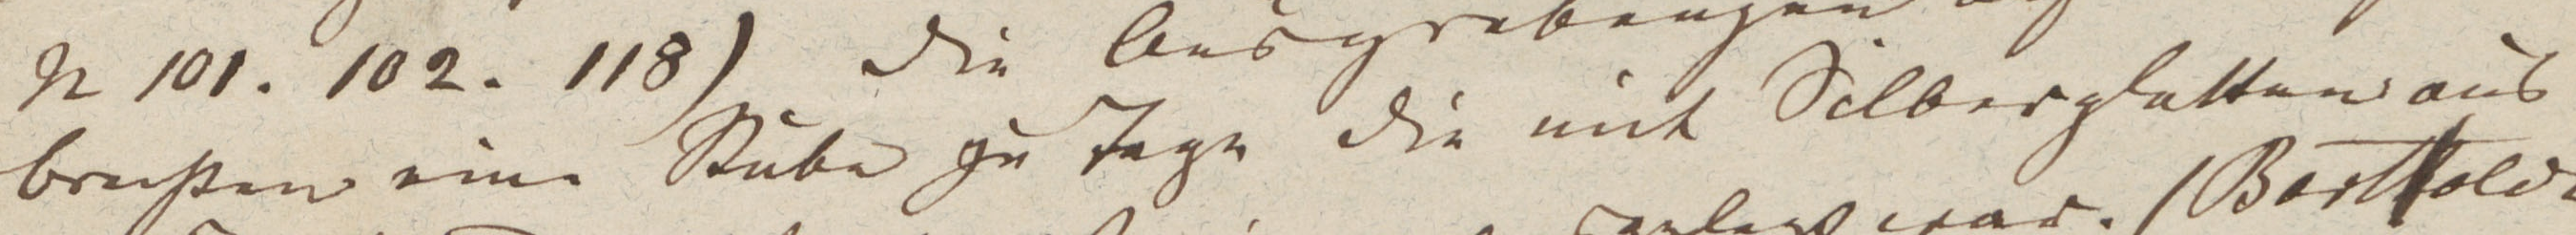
brachten eine Stube zu Tage die mit Silberplatten aus
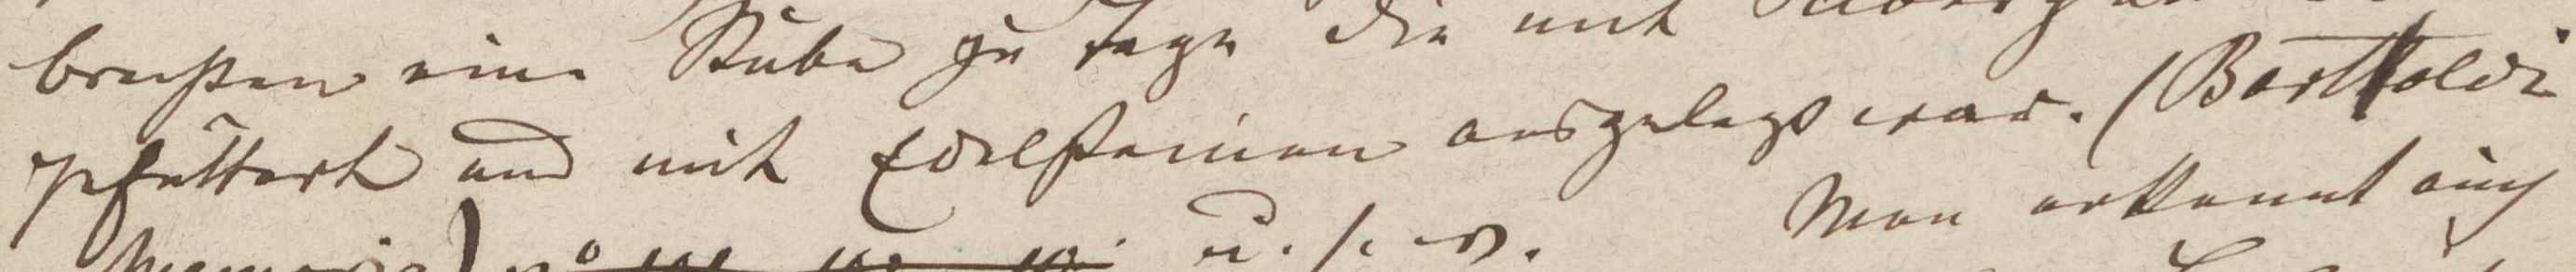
gefüttert und mit Edelsteinen ausgelegt war. (Bartholdi
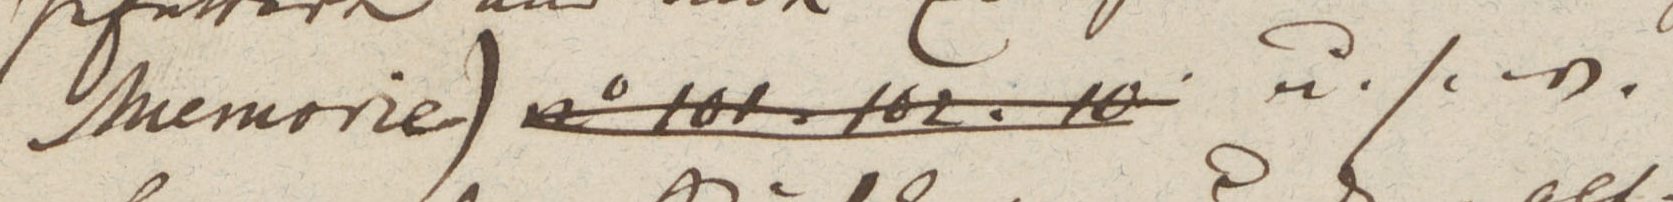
Memorie) n° 101. 102. 10 u. s. w.
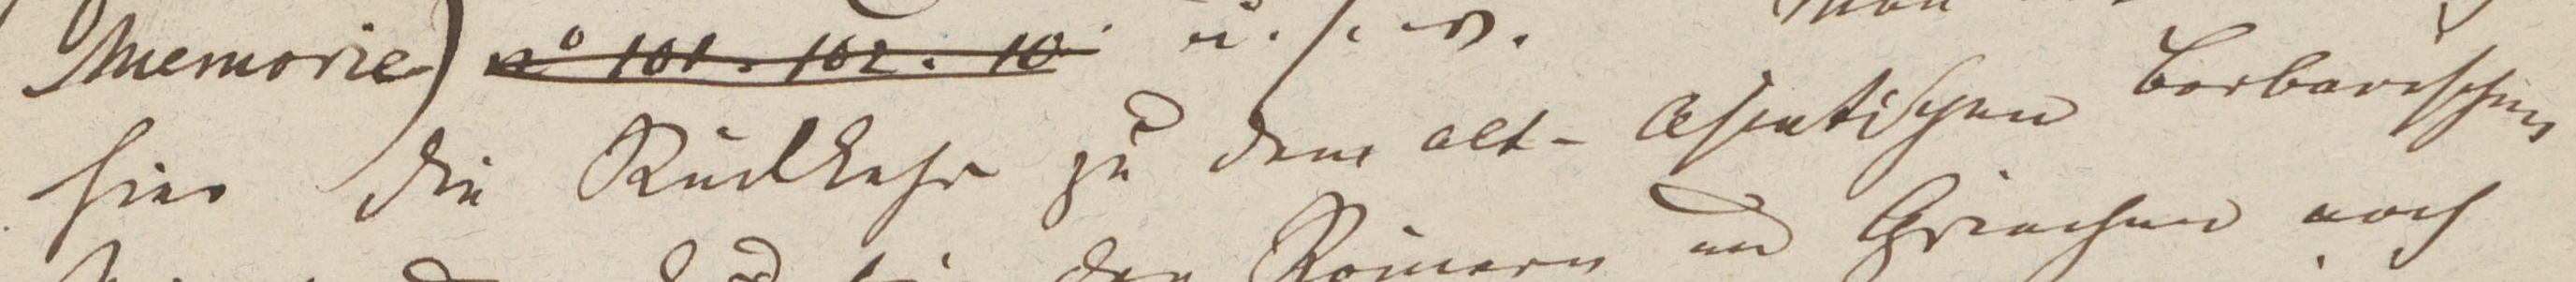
hier die Rückehr zu dem alt-Asiatischen Barbarischen
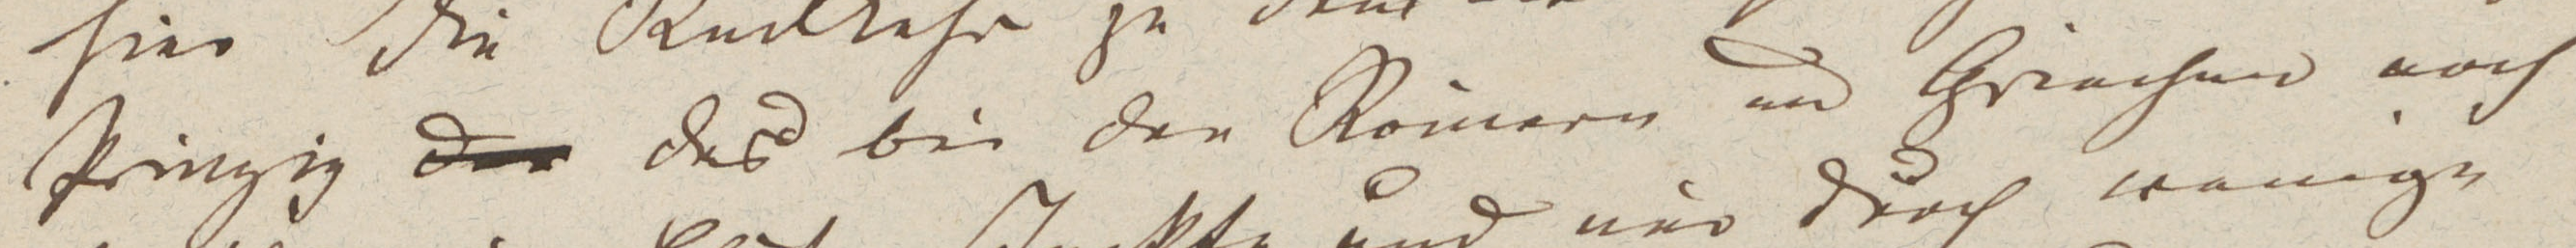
Prinzip der das bei den Römern und Griechen noch
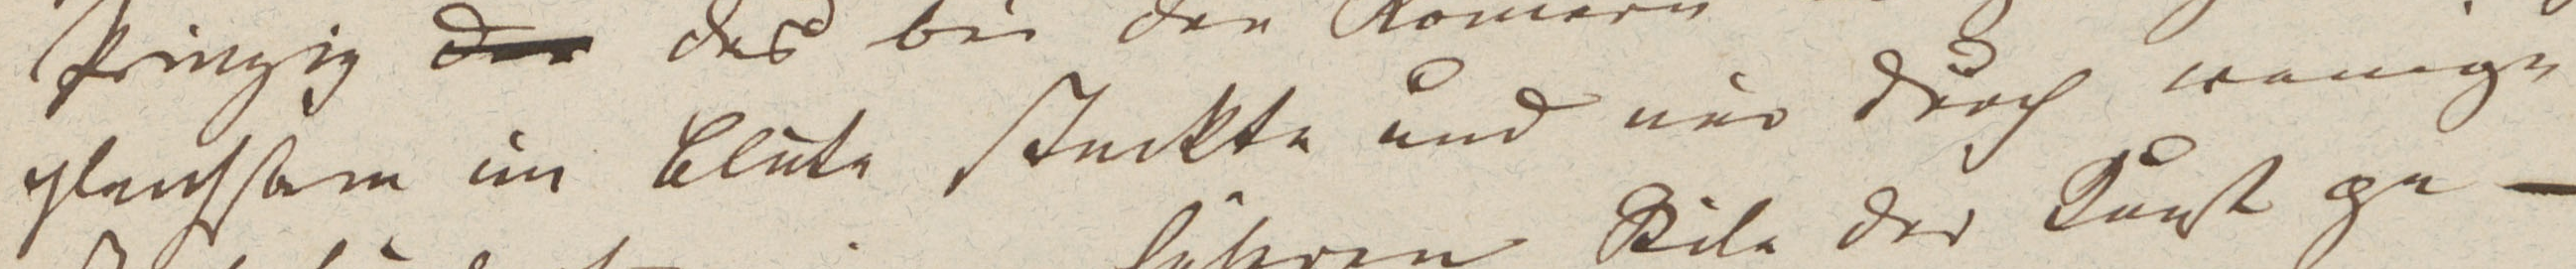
gleichsam im Blute steckte und nur durch wenige
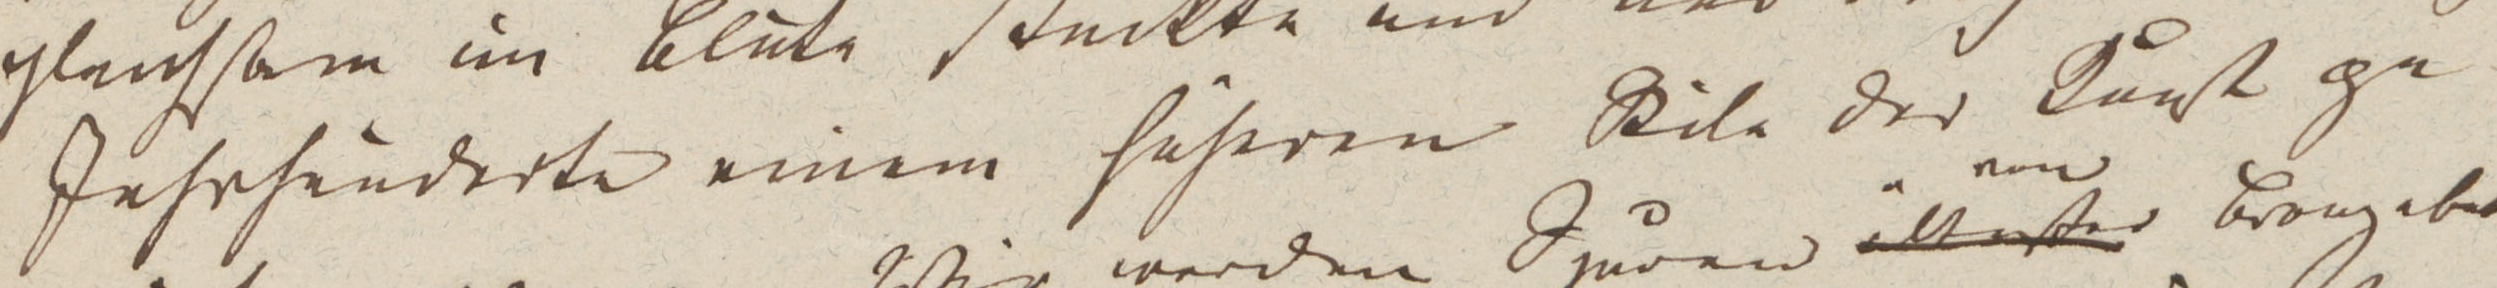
Jahrhunderte einem höheren Stile der Kunst ge-
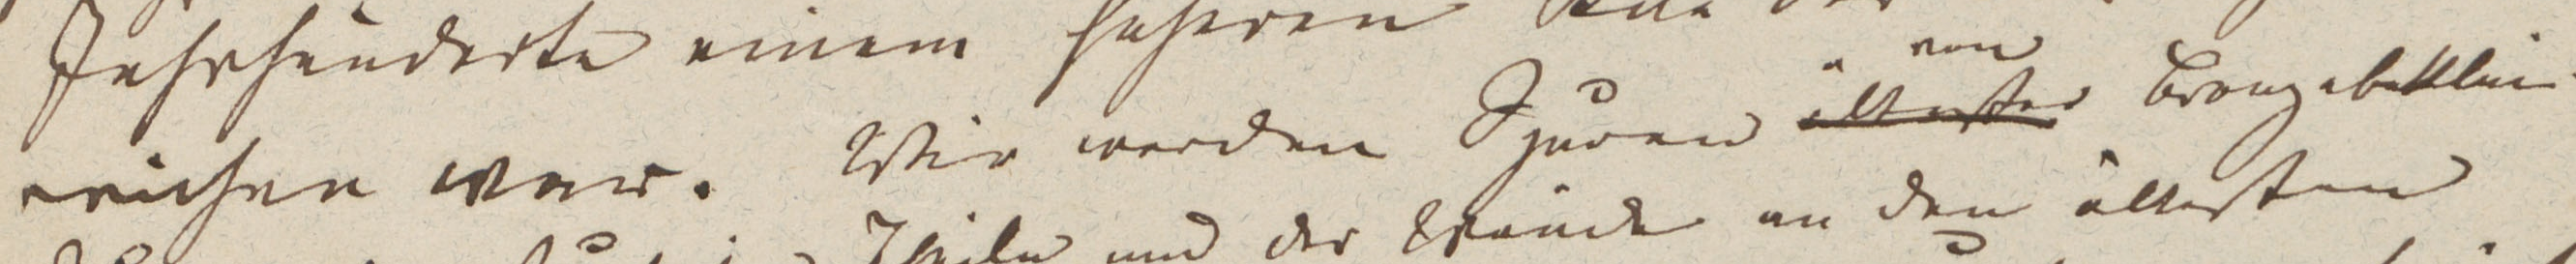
wichen war. Wir werden Spuren ältester von Bronzebeklei-
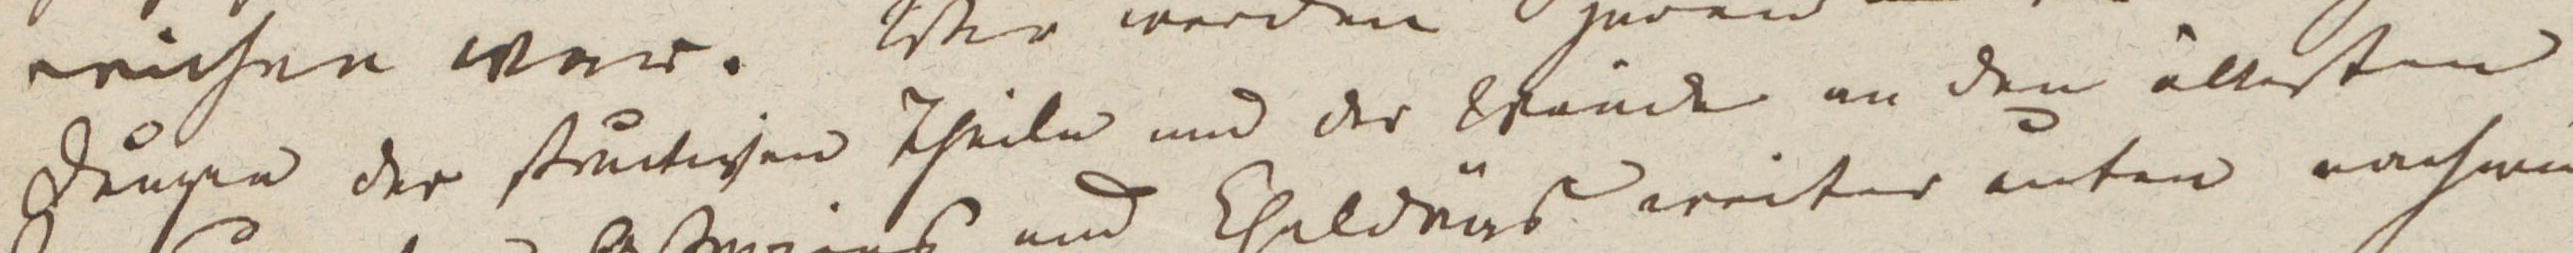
dungen der structiven Theile und der Wände an den ältesten
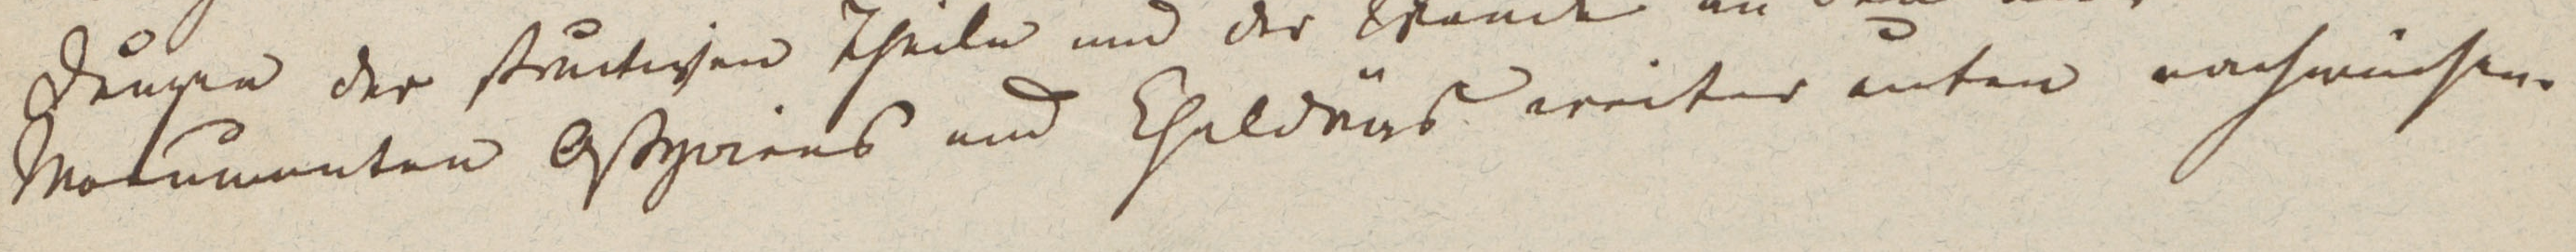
Monumenten Assyriens und Chaldäas weiter unten nachweisen.
